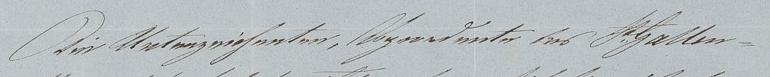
Die Unterzeichneten, Abgeordnete des St. Gallen-
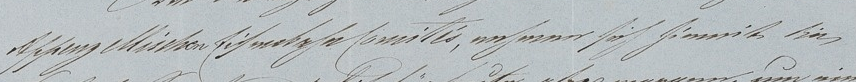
Appenzellischen Eisenbahn Comités, nehmen sich hiermit die
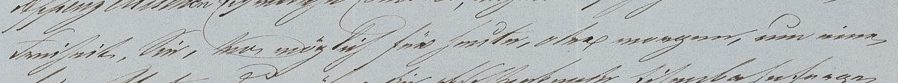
Freiheit, Sie, wo möglich für heute, oder morgen, um eine
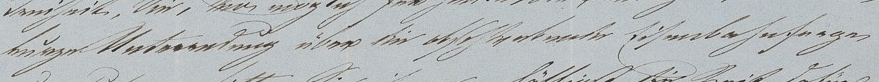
kurze Unterredung über die obschwebende Eisenbahnfrage
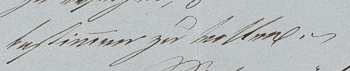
bestimmen zu wollen.
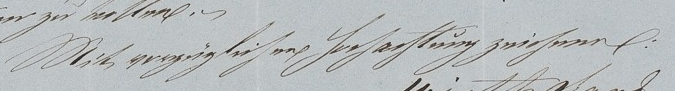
Mit vorzüglicher Hochachtung zeichnen:
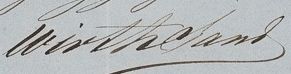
Wirth Sand
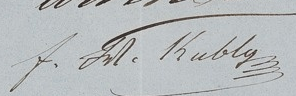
F. W. Kubly
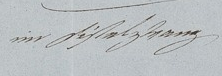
im Distelzwang
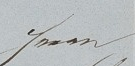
Herrn
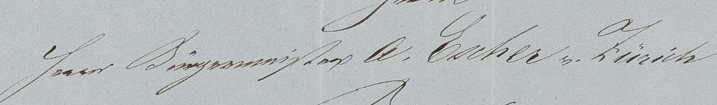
Herrn Bürgermeister A. Escher v. Zürich
